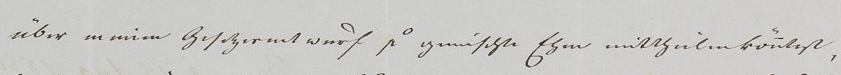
über meinen Gesetzesentwurf po gemischte Ehen mittheilen könntest,
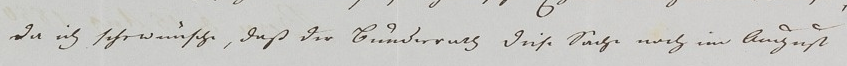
da ich sehr wünsche, das der Bundesrath diese Sache noch im August
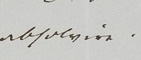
absolvire.
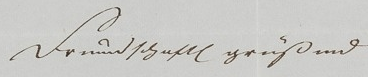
Freundschaftlich grüßend
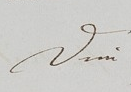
Dein
